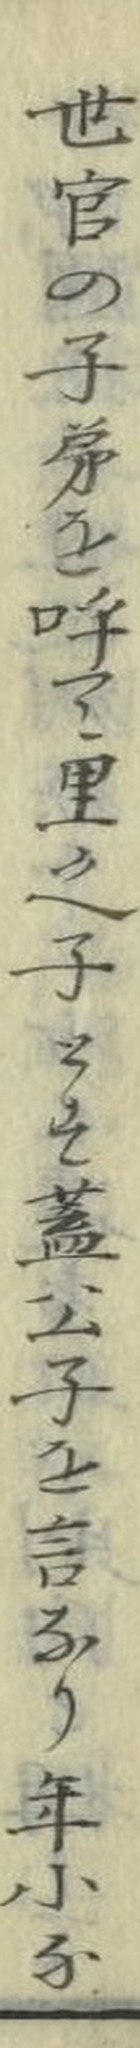世官の子弟を呼り里之子とす蓋公子を言なり年小な
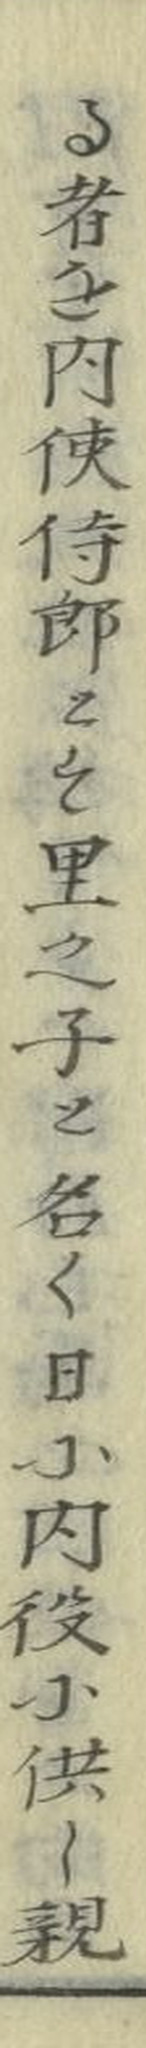る者を内使侍郎とす里之子と名く日に内役に供し親
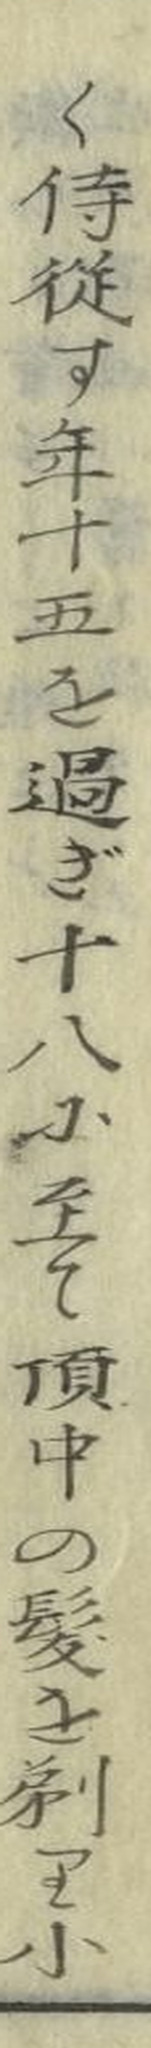く侍従す年十五を過ぎ十八に至て頂中の髪を剃り小
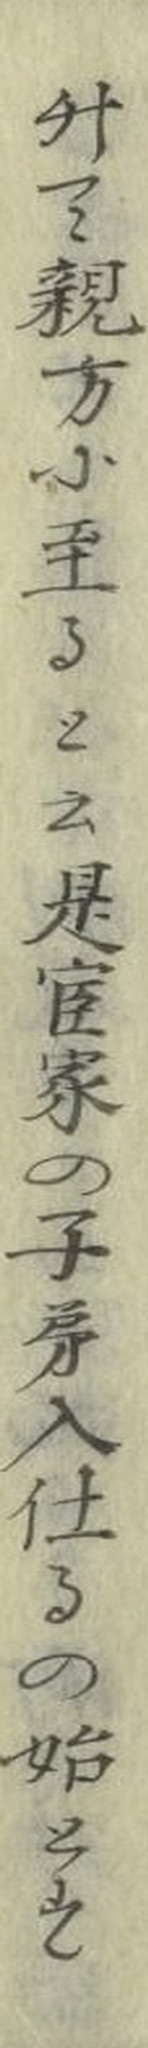升り親方に至ると云是宦家の子弟入仕るの始とす
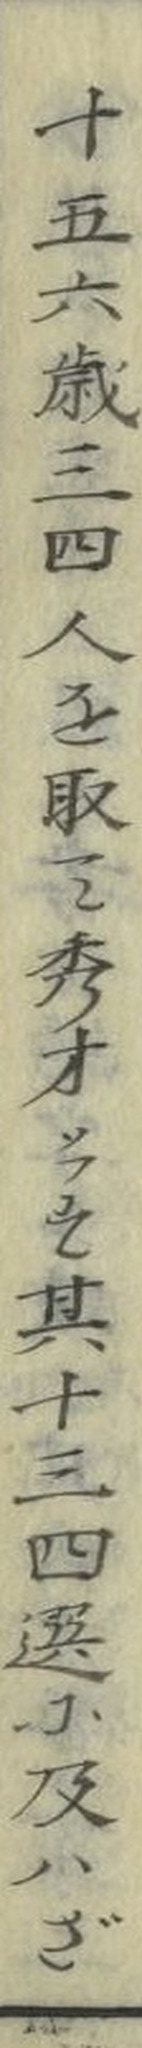十五六歳三四人を取て秀才とす其十三四選に及はざ

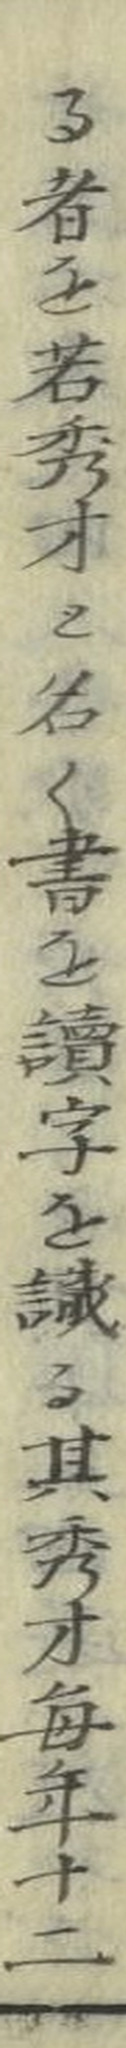る者を若秀才と名く書を読字を識る其秀才毎年十二
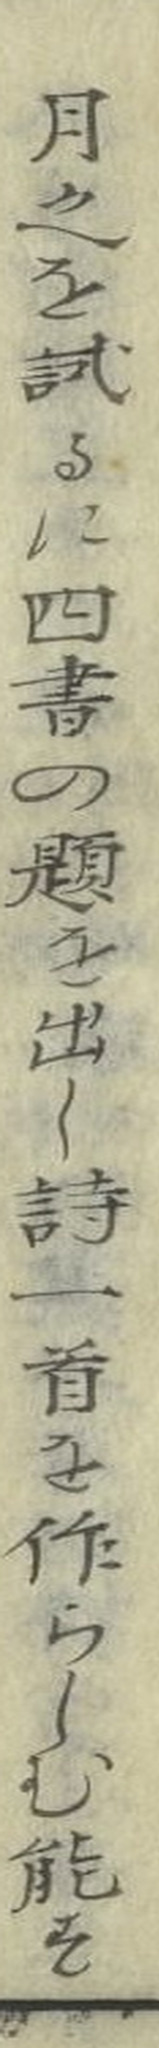月之を試るに四書の題を出し詩一首を作らしむ能す
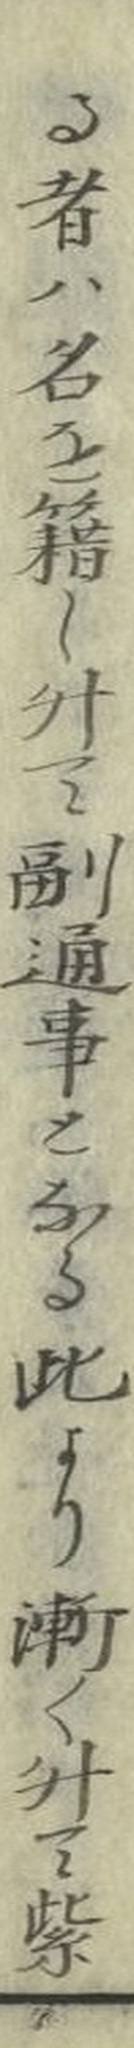る者は名を籍し升て副通事となる此より漸く升る紫
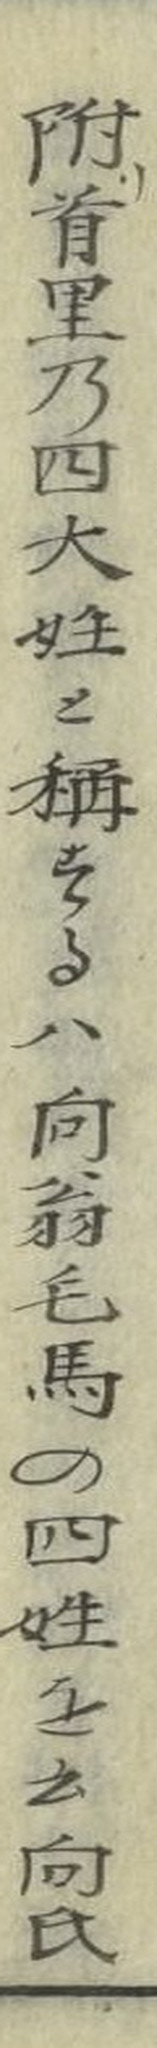附首里の四大姓と称するは向翁毛馬の四姓を云向氏
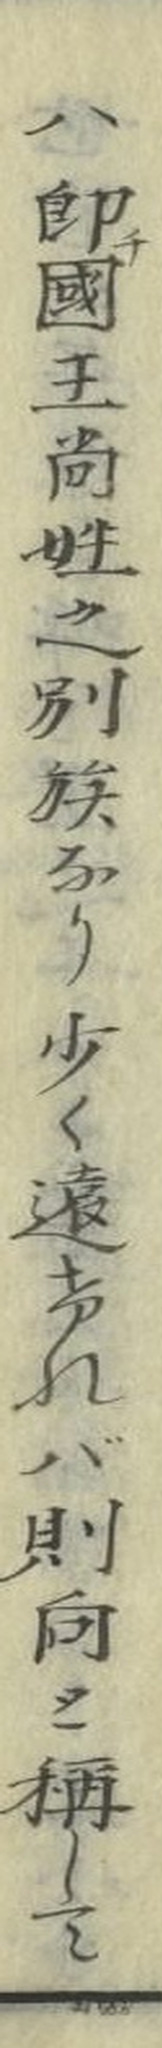は即国王尚姓之別族なり少く遠ければ則向と称して
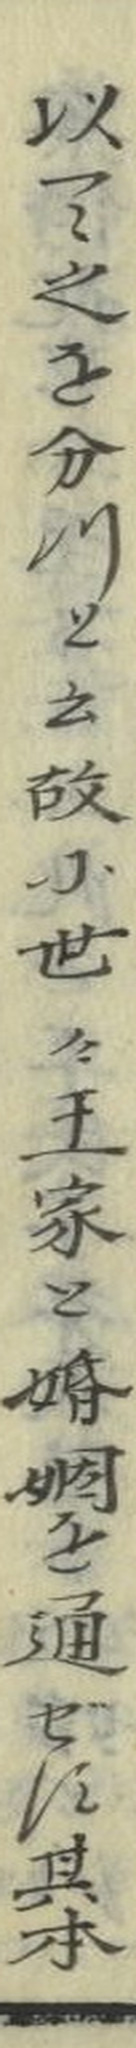以て之を分つと云故に世々王家と王家と婚姻を通ぜす其本
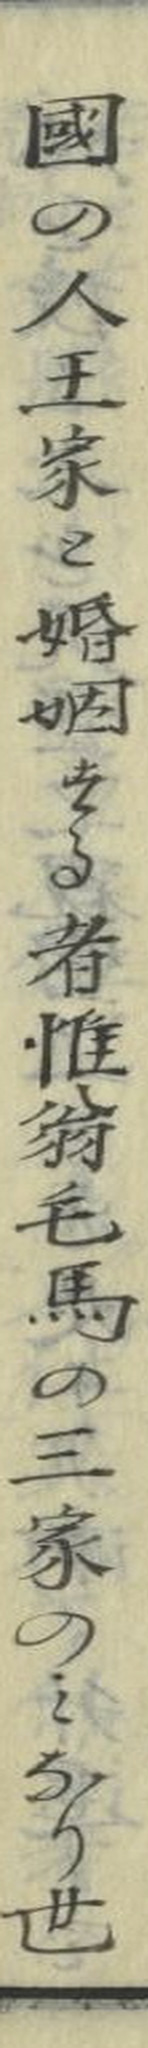国の人王家と婚姻する者惟翁馬の三家のみなり世
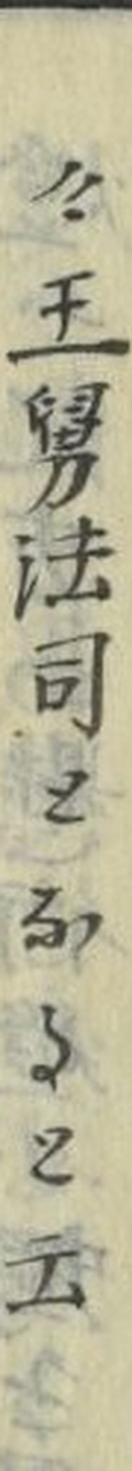々王舅法司となると云
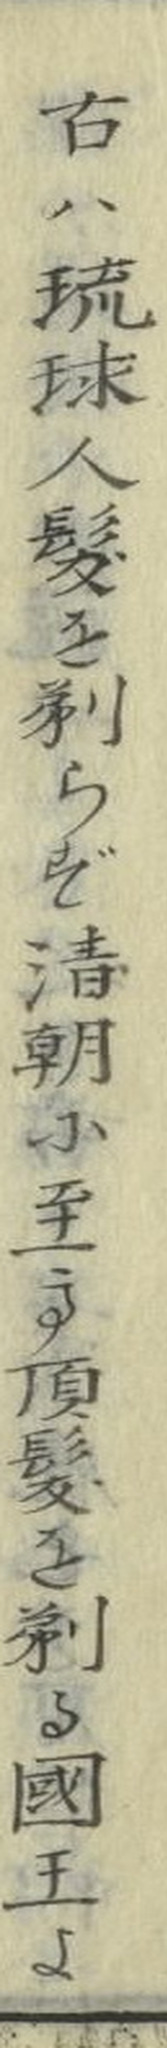古は琉球人髪を剃らず清朝に至て頂髪を剃る国王よ
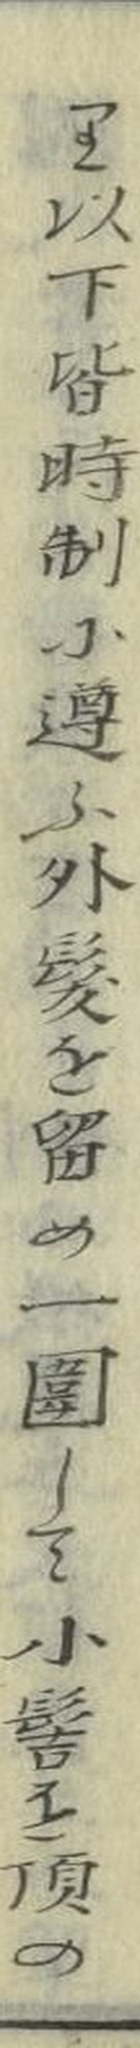り以下皆時制に遵ふ外髪を留め一囲して小髻を頂の
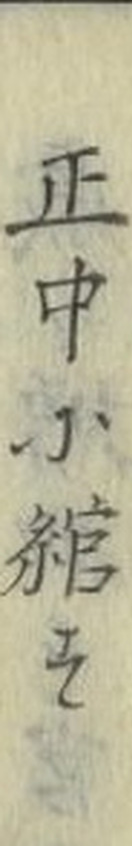正中に綰す
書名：琉球沿革志 上
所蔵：University of the Ryukyus Library
